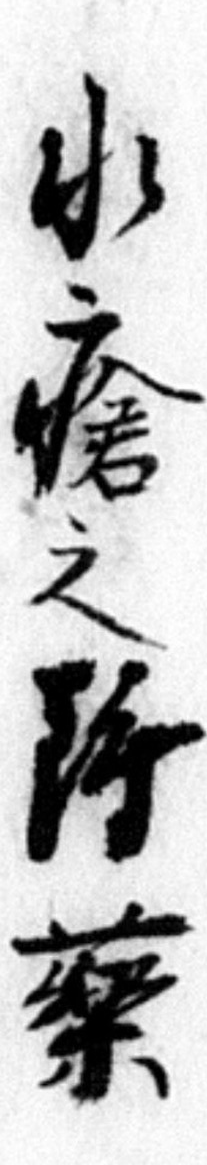水瘡之附薬
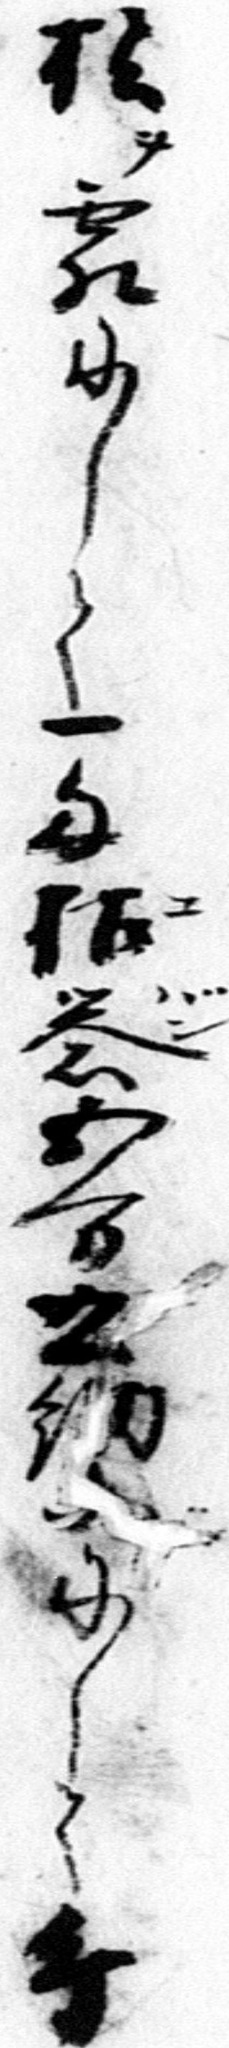桧を霜にして一匁枯礬五分右細末にして付
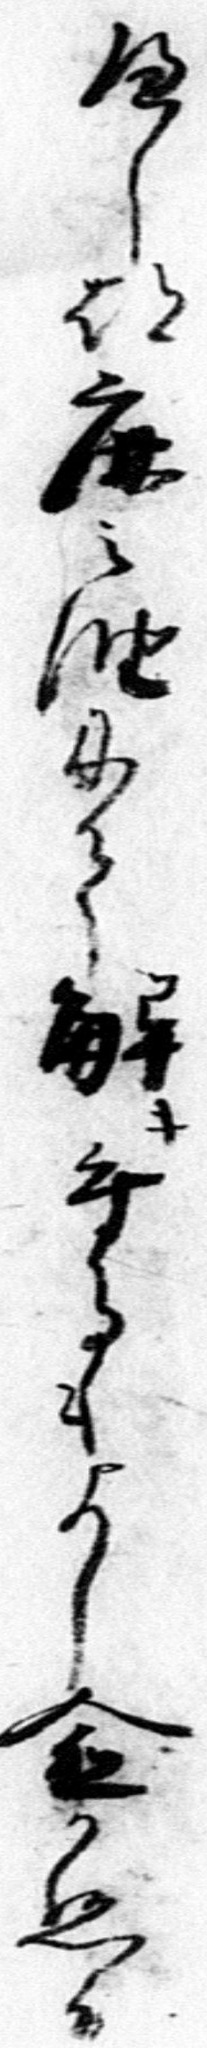へし胡麻の油にて解き付るもよし愈かぬる
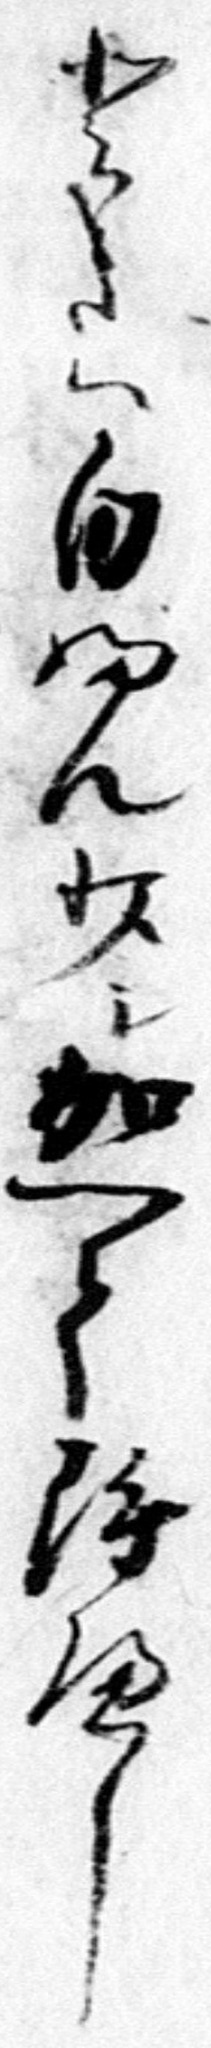ときは白ふん少し加へて附へし
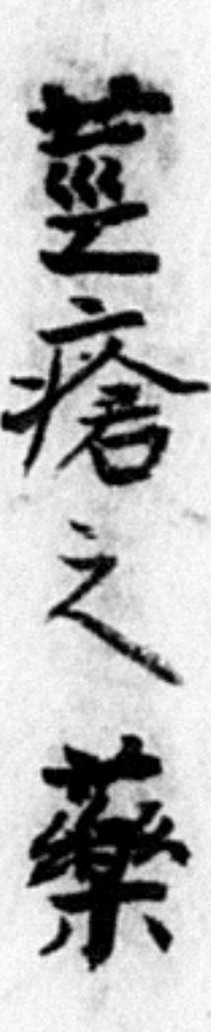莖瘡の薬
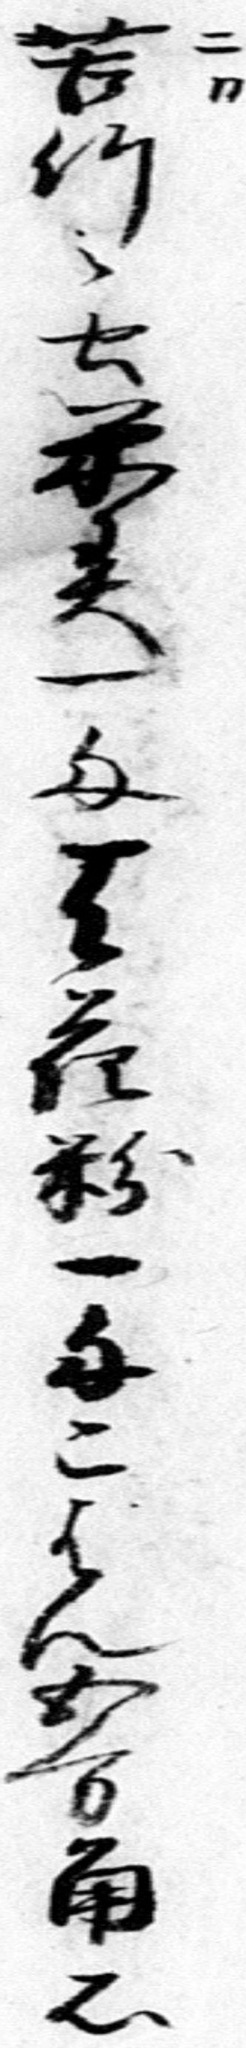苦竹の虫糞一匁天花粉一匁こはん五分角石
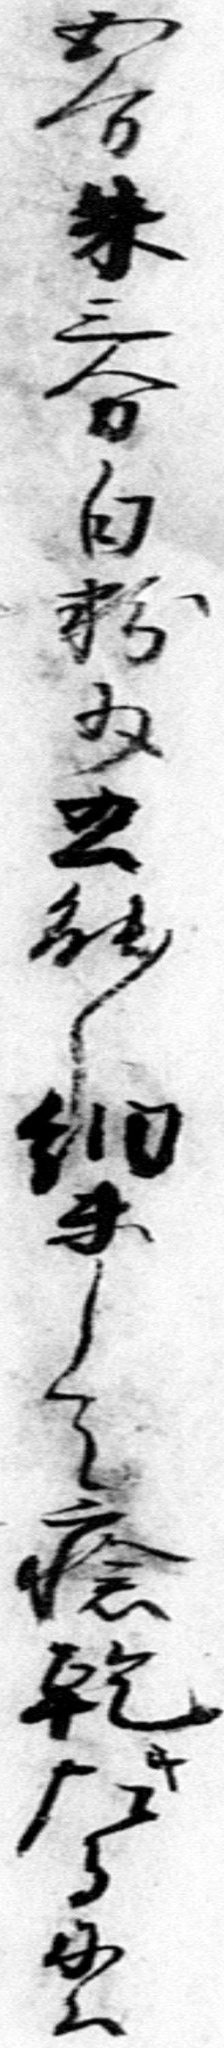五分朱三分白粉少右能く細末して瘡乾きたるには
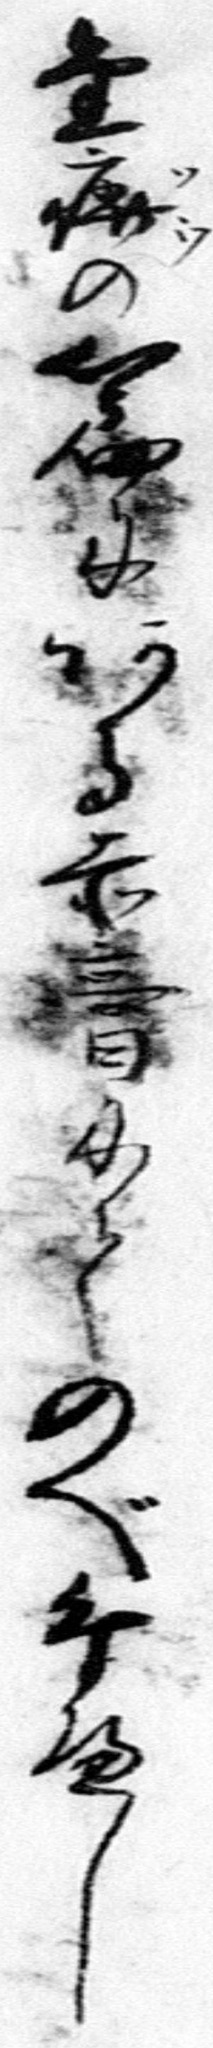金瘡の篇にある赤膏にてのべ付へし

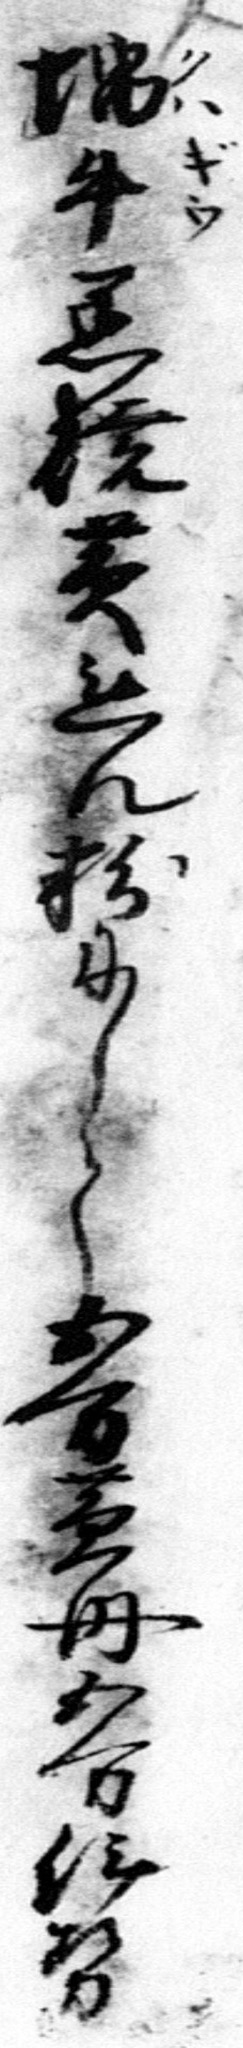蝸牛黒焼黄れん粉にして五分黄丹五分伊勢
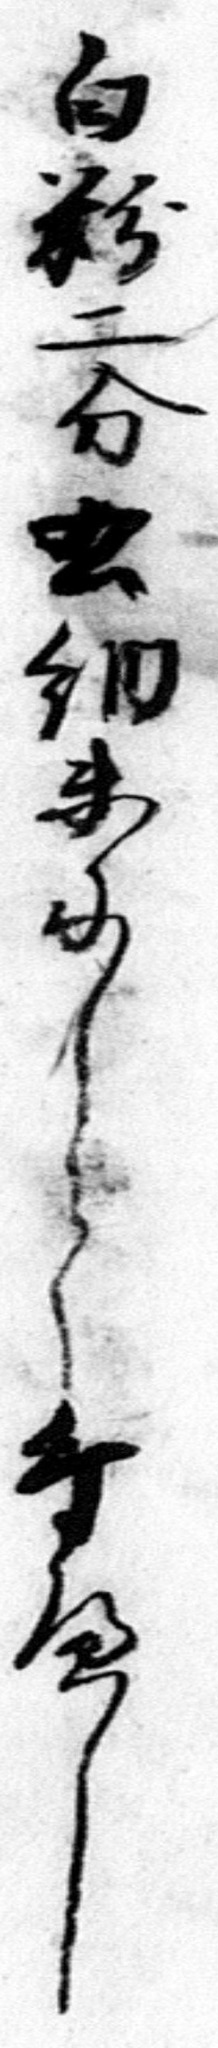白粉二分右細末にして付へし
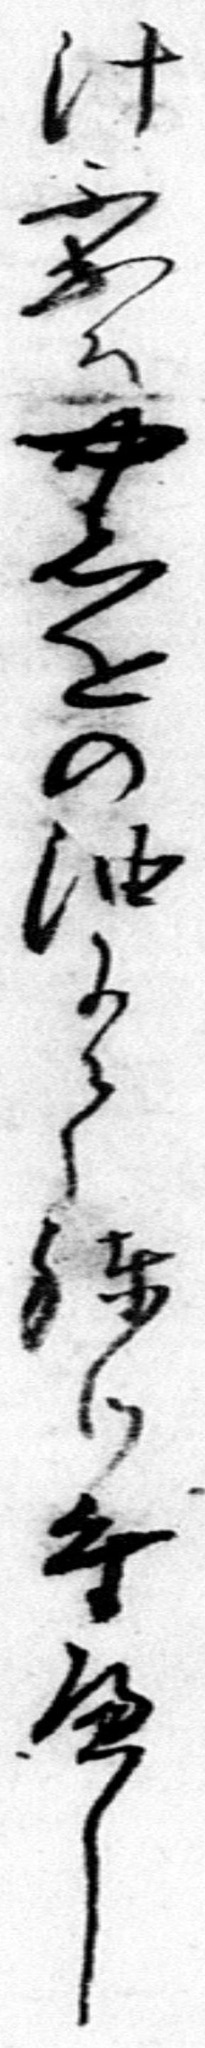汁不出はやしをの油にて錬り付へし
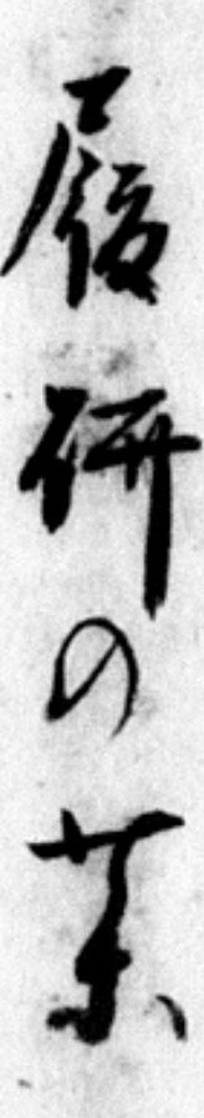履研の薬
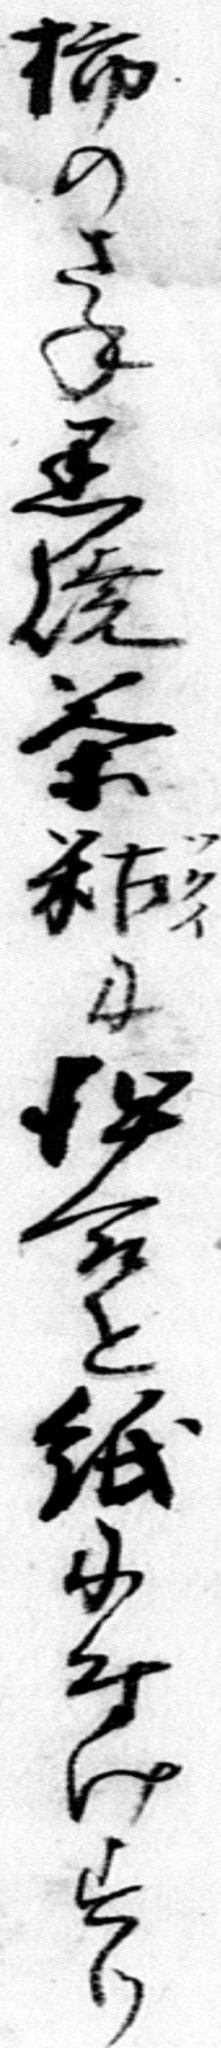柿のさね黒焼茶粘に合せ紙に付けすり
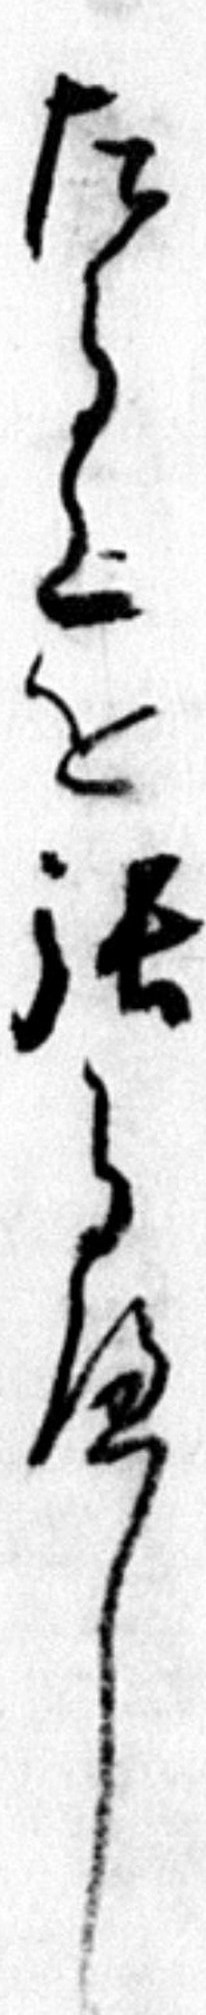たる上を張るへし
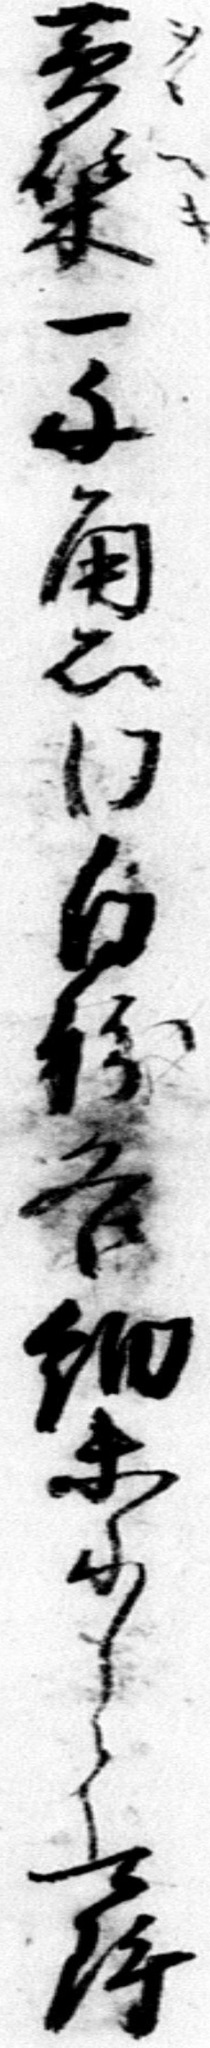黄檗一匁角石同白粉各細末にして可附
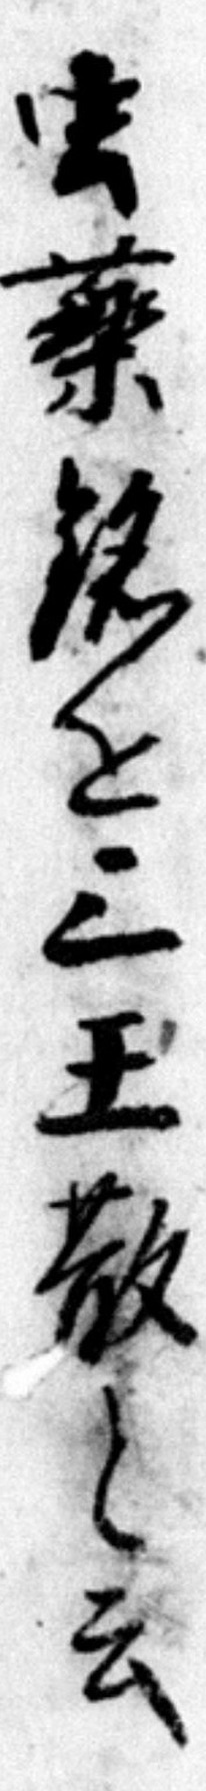虫薬銘を三玉散と云
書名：名薬秘伝之書
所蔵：徳島県立図書館
